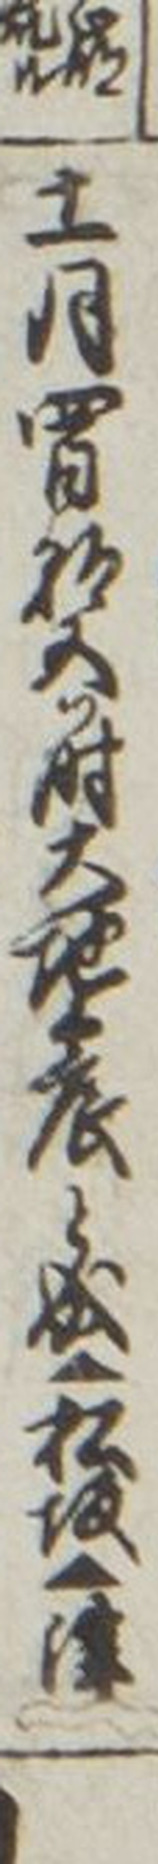十一月四日朝五つ時大地震と成▲松阪▲津
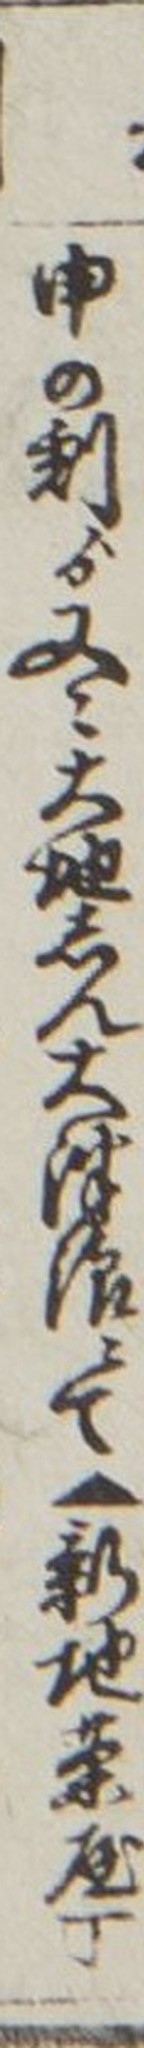申の刻より又々大地しん大津浪にて▲新地茶屋町
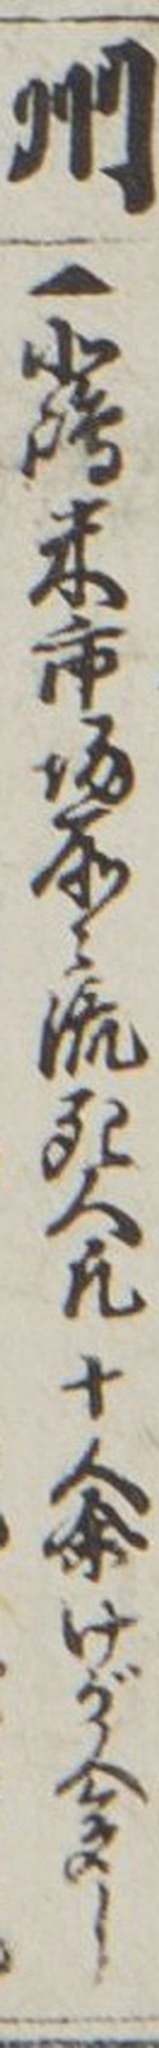▲北島米市場所々流死人凡十人余けが人多し
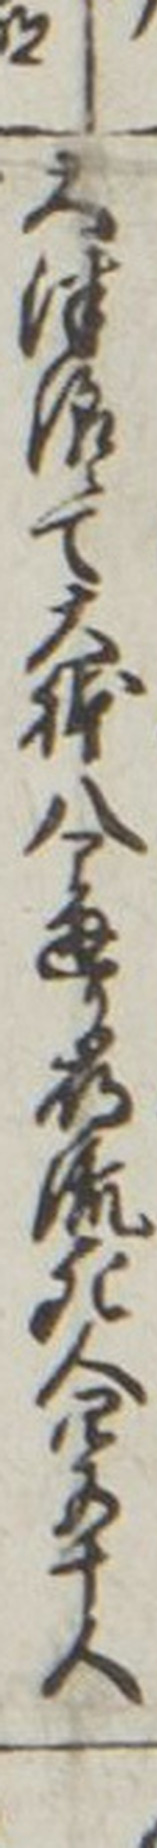大津浪にて大体八部通り崩流死人四五十人
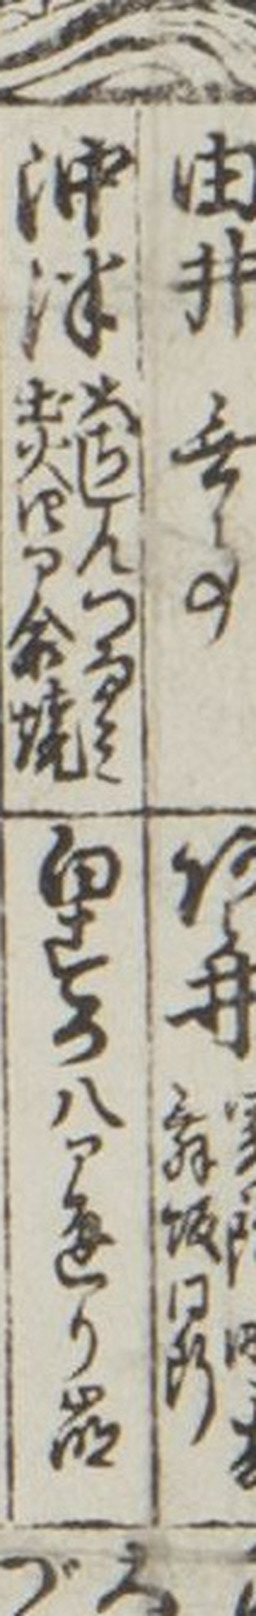沖津大ぢしんつなみ
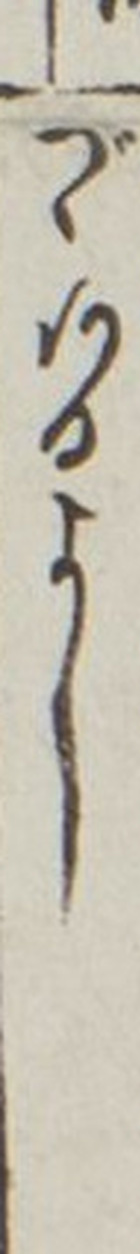づゝあるよし
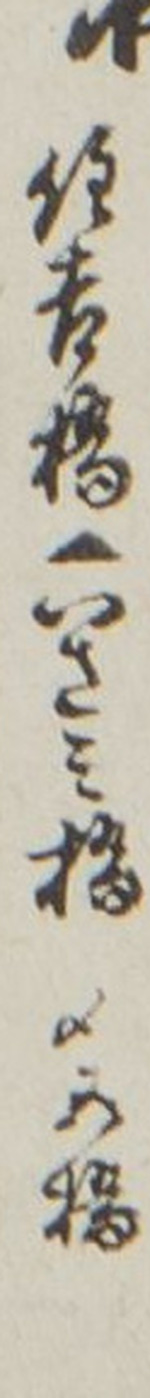住吉橋▲いさみ橋〆五橋
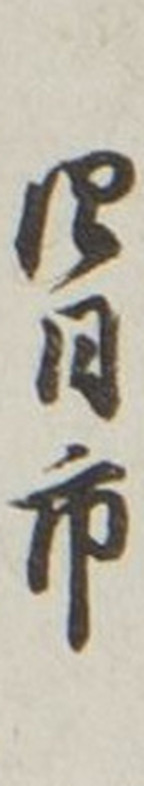四日市
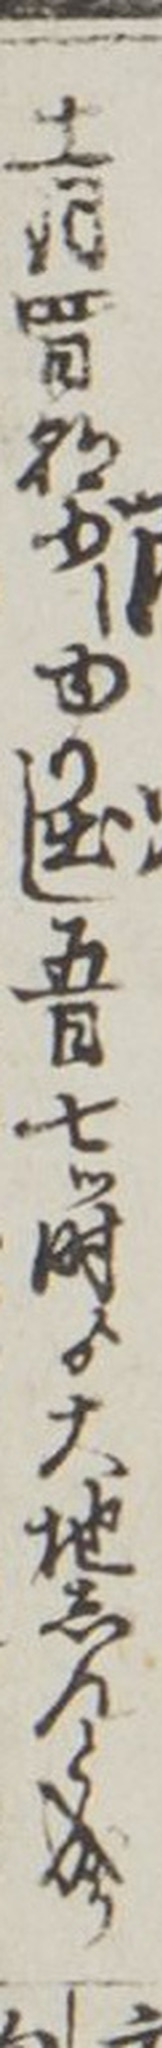十一月四日朝少しゆり出し五日七ツ時より大地しんと成り
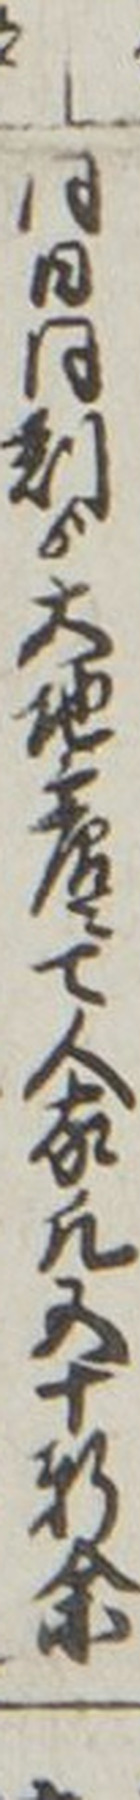同日同刻より大地震にて人家凡五十軒余
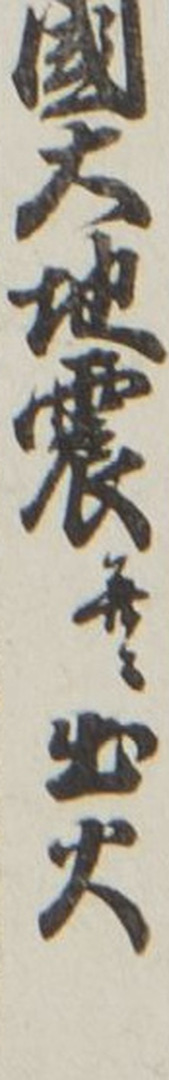諸国大地震并に出火
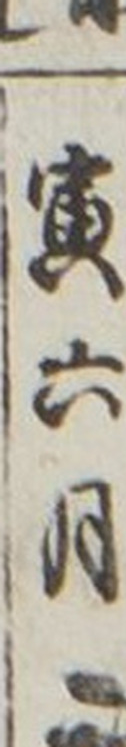寅六月
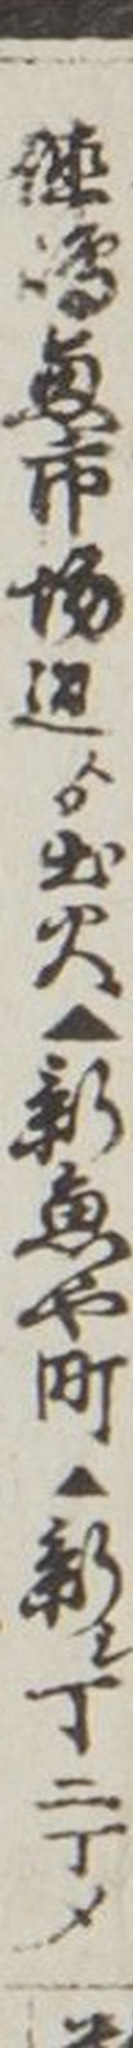徳島魚市場辺より出火▲新魚や町▲新シ町二丁メ
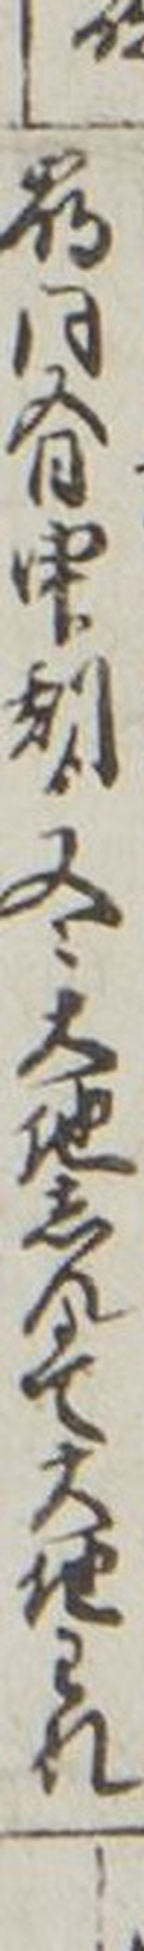崩同五日申刻より又々大地しんにて大地われ
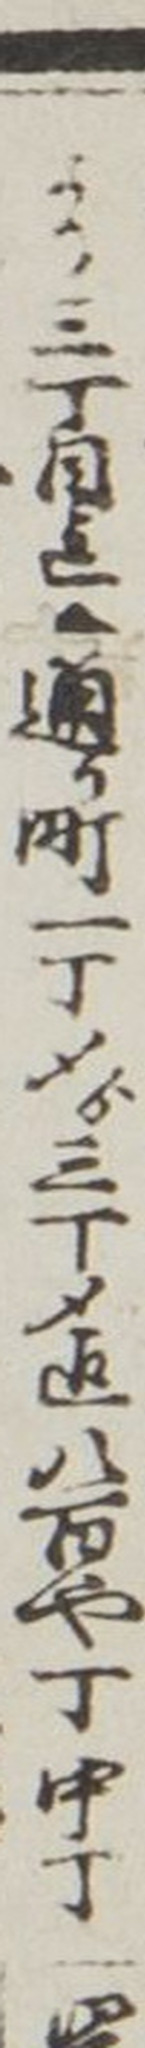より三丁目迄▲通り町一丁メより三丁メ迄八百や町中町
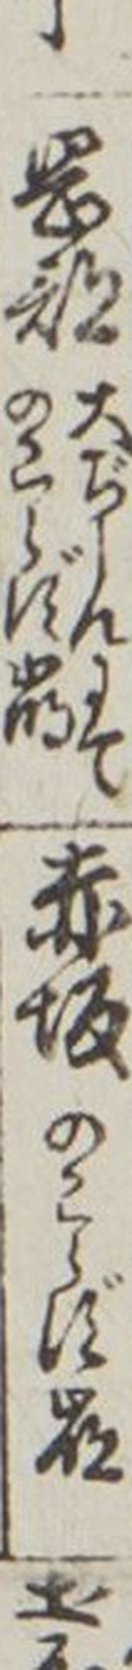赤坂のこらず崩
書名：嘉永七年寅十一月諸国大地震大津波并出火
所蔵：あいおいニッセイ同和損保株式会社
